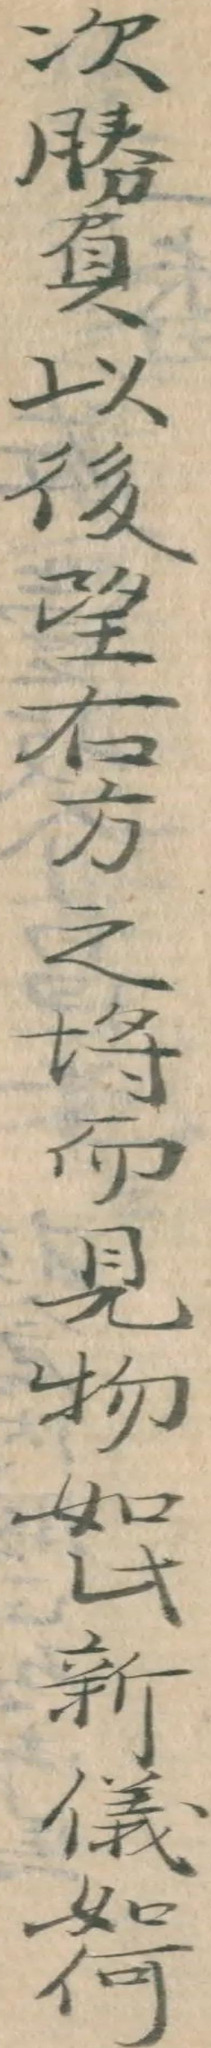次勝負以後望右方之埒而見物如此新儀如何
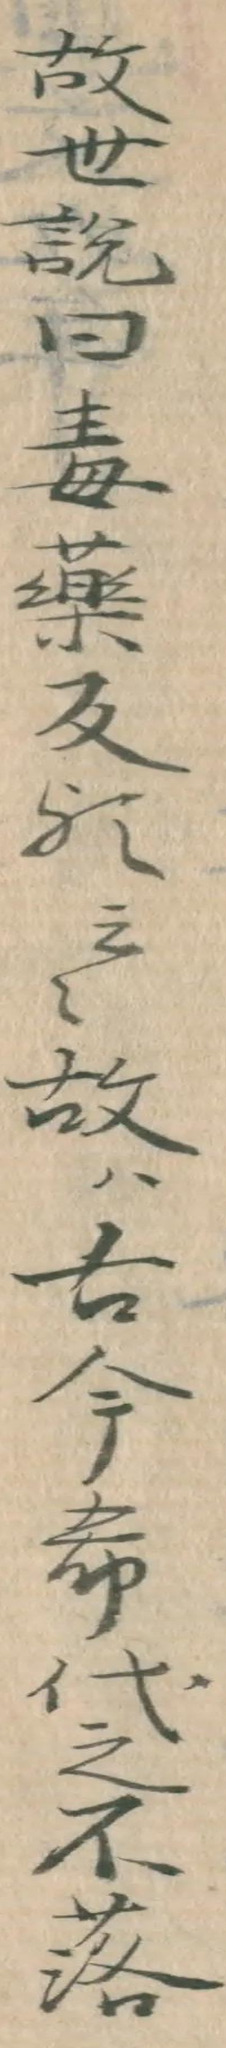故世説曰毒薬反歟云々故ハ古今希代之不落
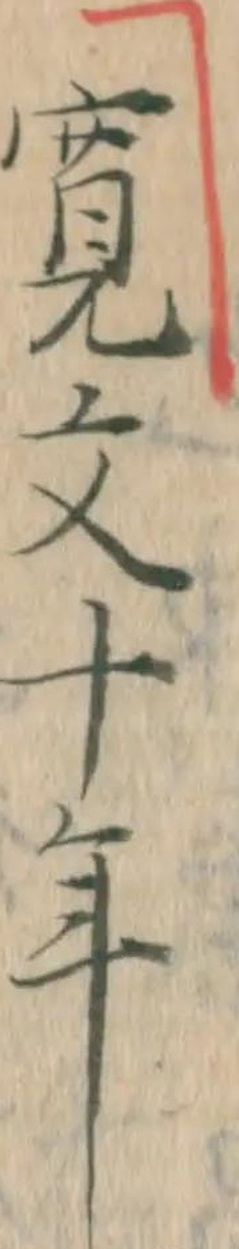寛文十年
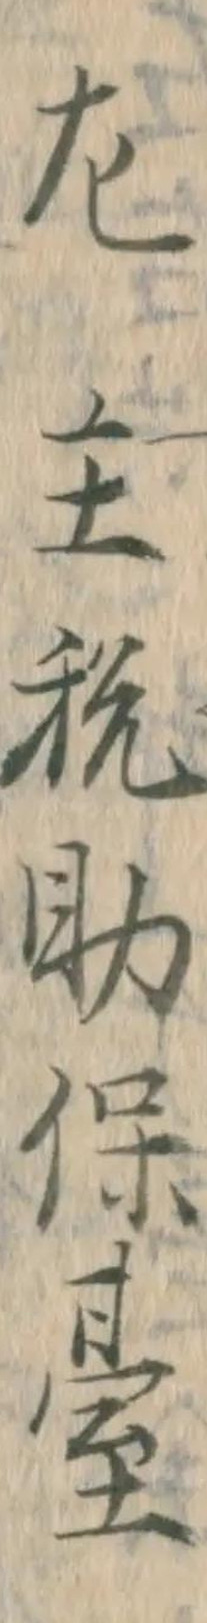左主税助保台
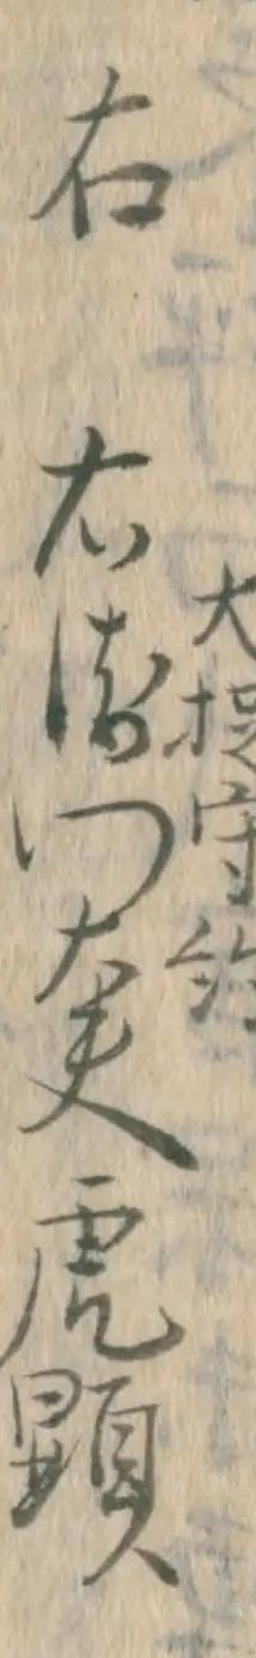右右衛門大夫虎顕
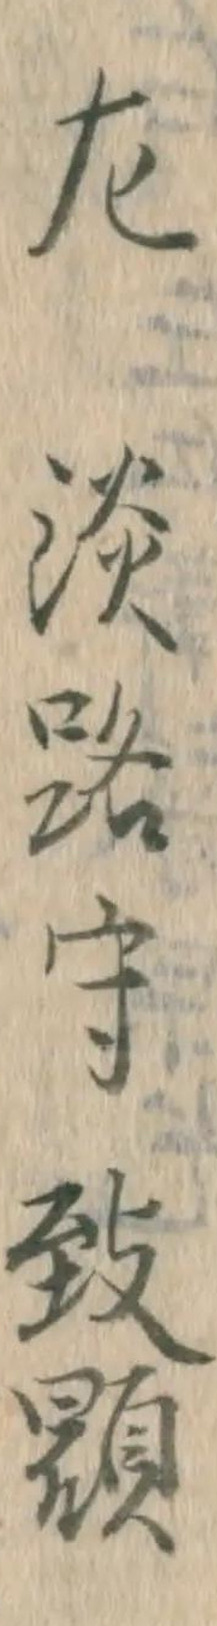左淡路守致顕
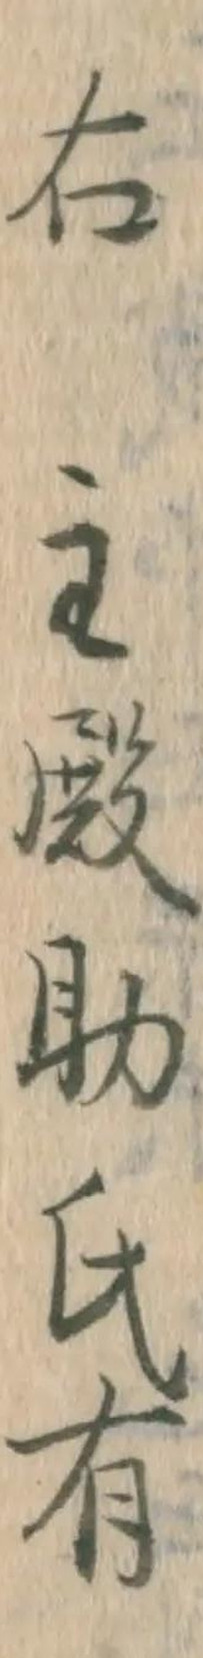右主殿助氏有
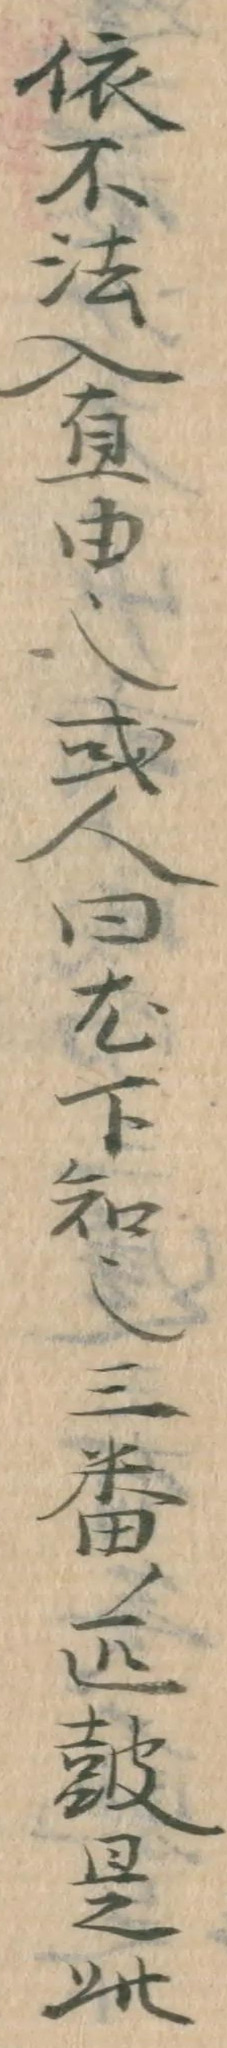依不法入直由也或人曰尤下知也三番ノ匹鼓是此
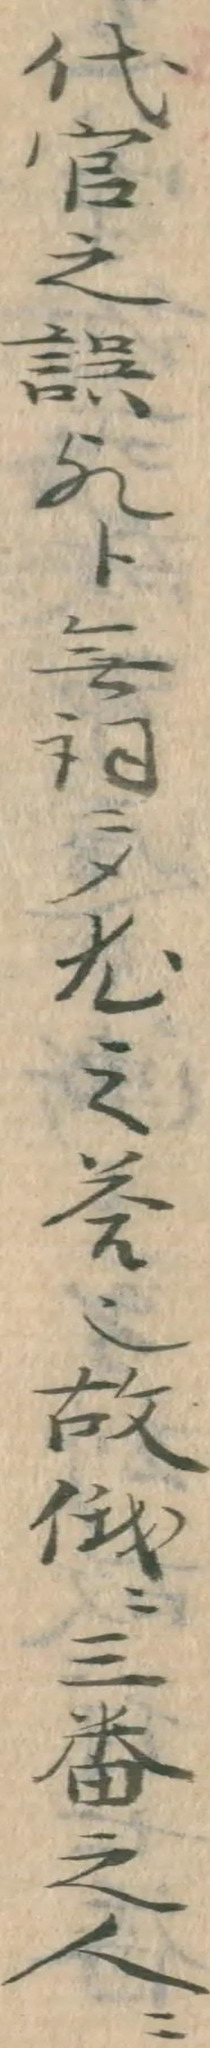代官之誤歟ト無詞ニシテ尤之答也故俄ニ三番之人ニ
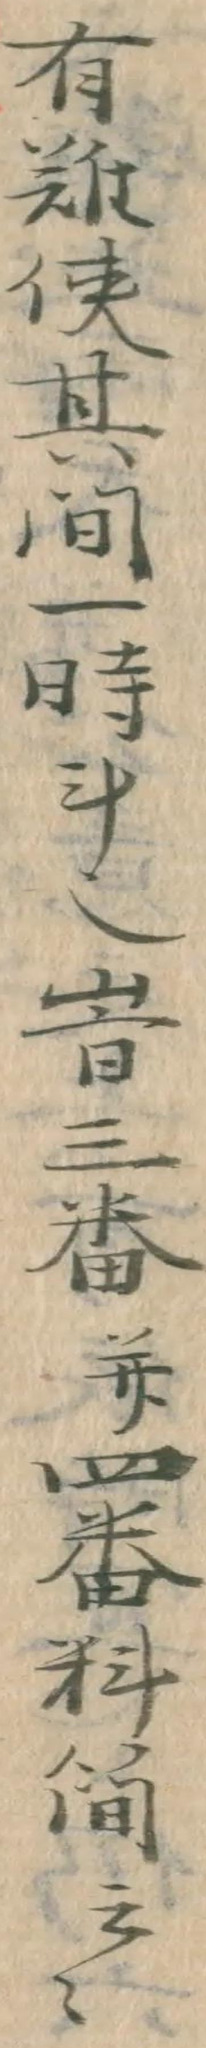有難使其間一時計也旹三番并四番料簡云々
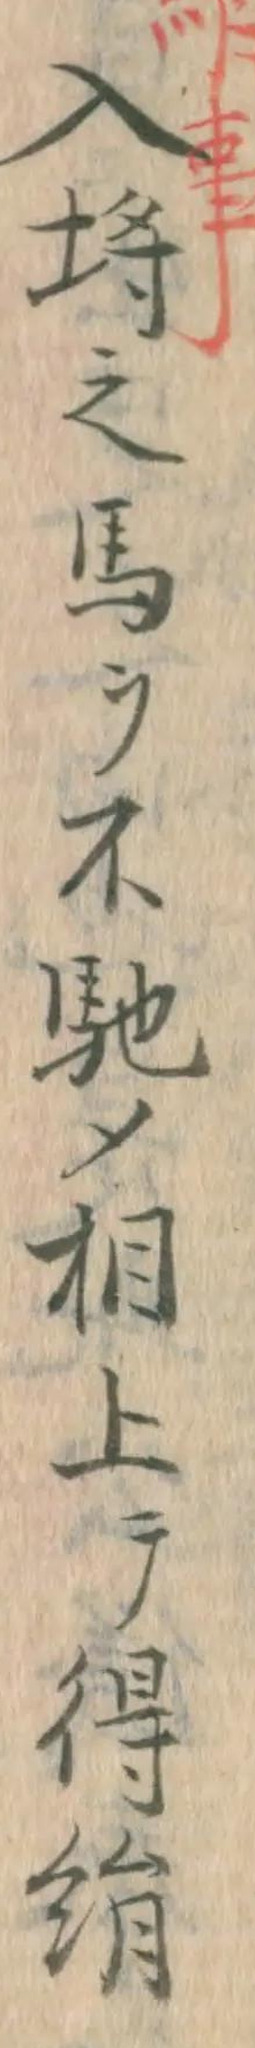入埒之馬ヲ不馳シテ相上テ得絹
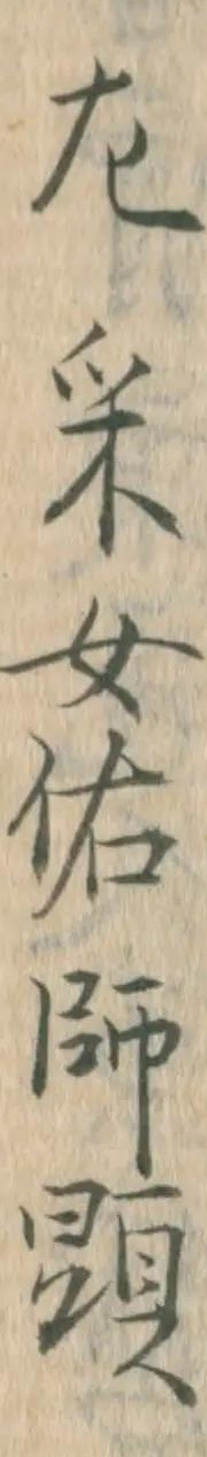左采女佑師顕
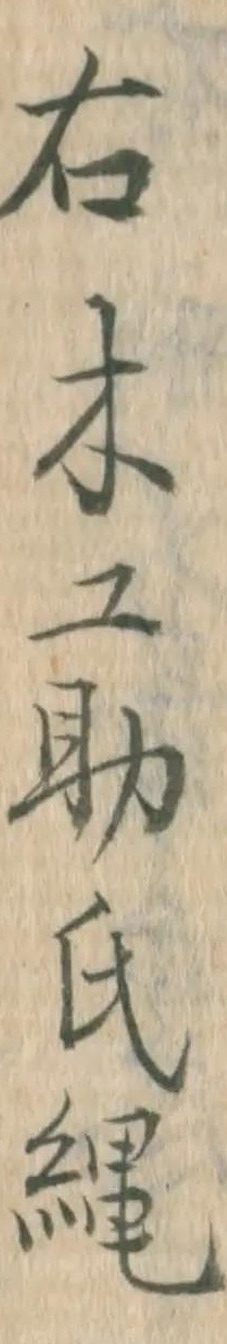右木工助氏縄
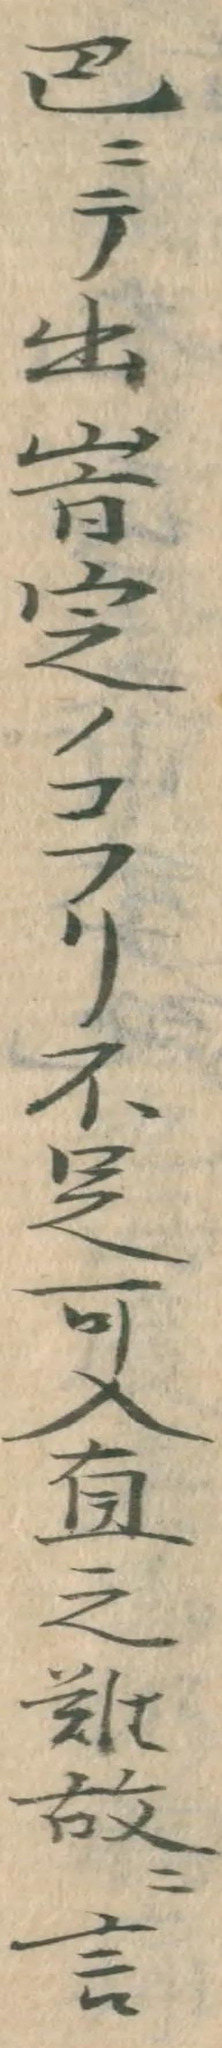巴ニテ出旹定ノコフリ不足可入直之難故ニ言
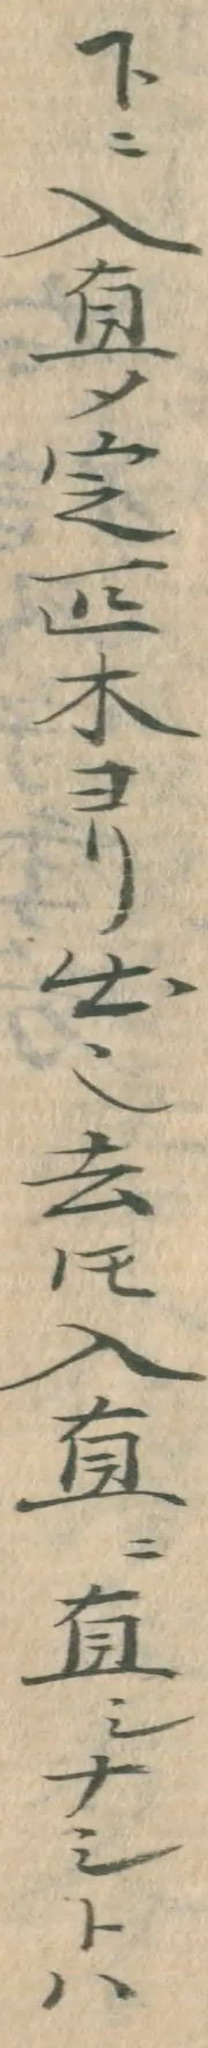下ニ入直シテ定匹木ヨリ出也去トモ入直ニ直シナシトハ
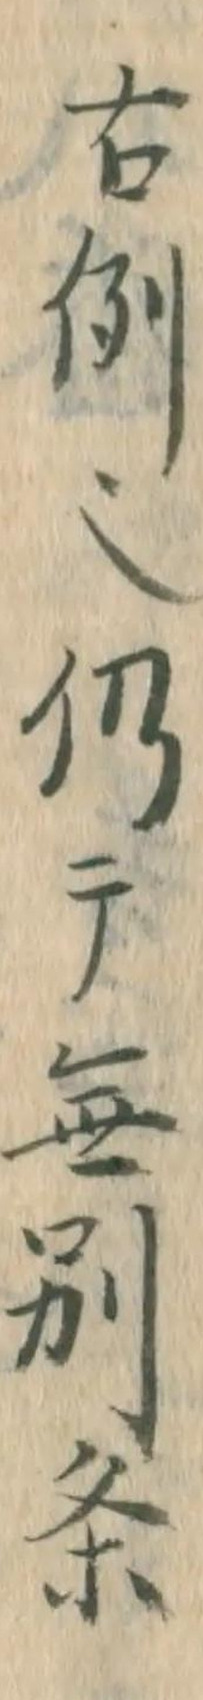古例也仍テ無別条
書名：賀茂社記録. 第10冊
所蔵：国立国会図書館 National Diet Library, JAPAN
